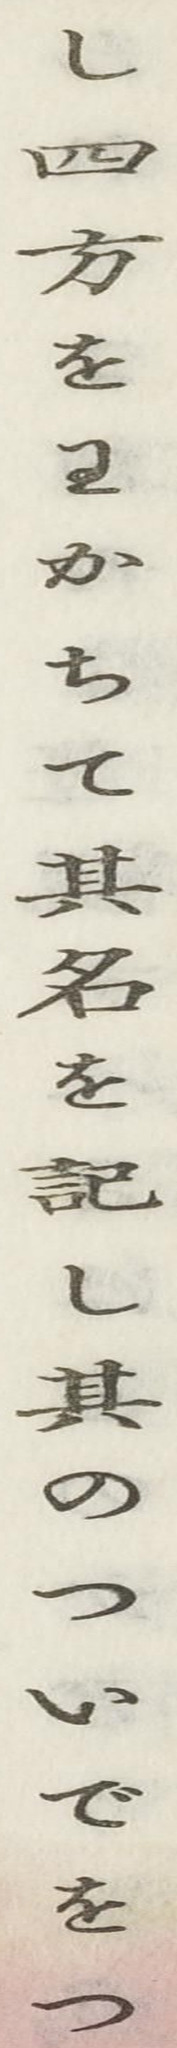し四方をわかちて其名を記し其のついでをつ
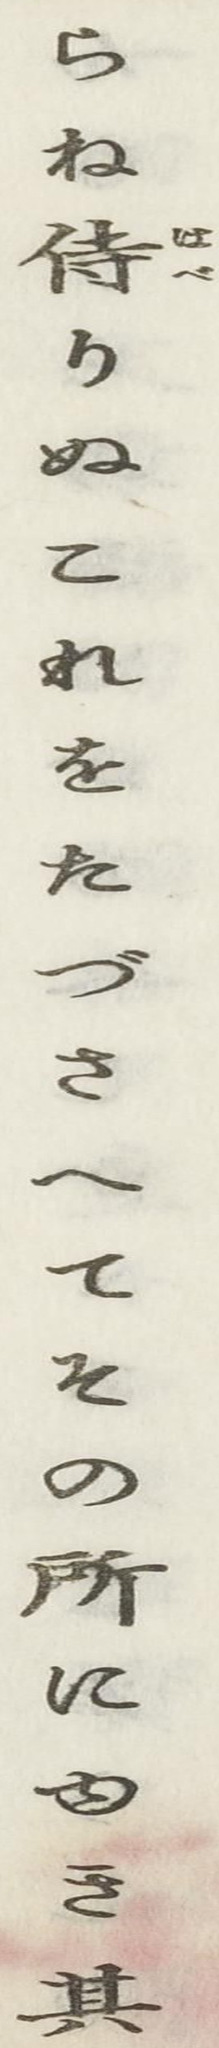らね侍りぬこれをたづさへてその所にゆき其
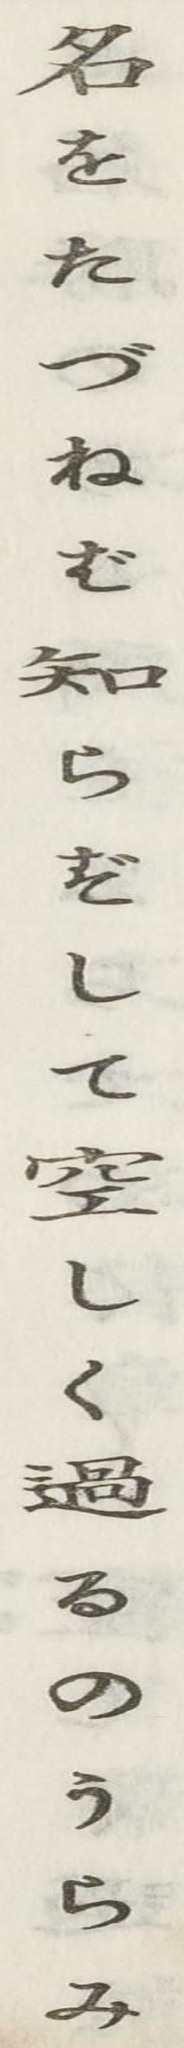名をたづねば知らずして空しく過るのうらみ
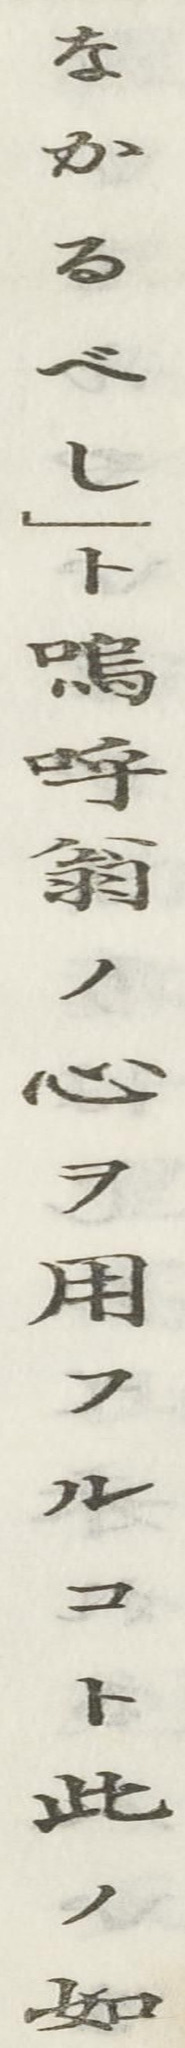なかるべし」ト嗚呼翁ノ心ヲ用フルコト此ノ如
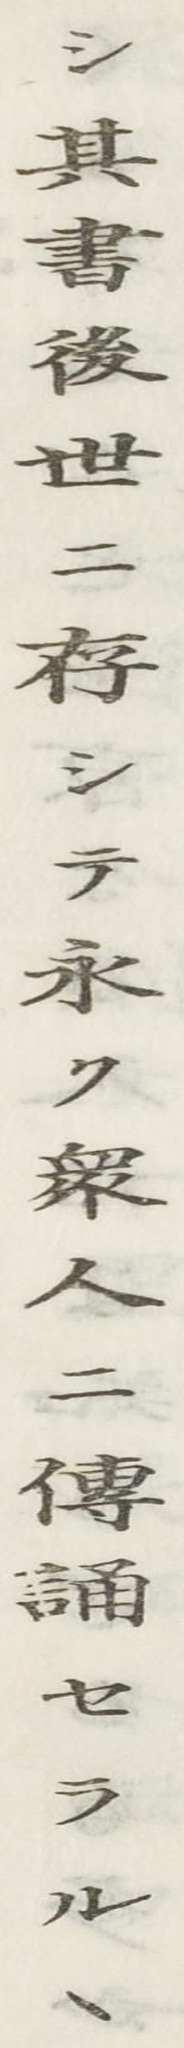シ其書後世ニ存シテ永ク衆人ニ傳誦セラルヽ
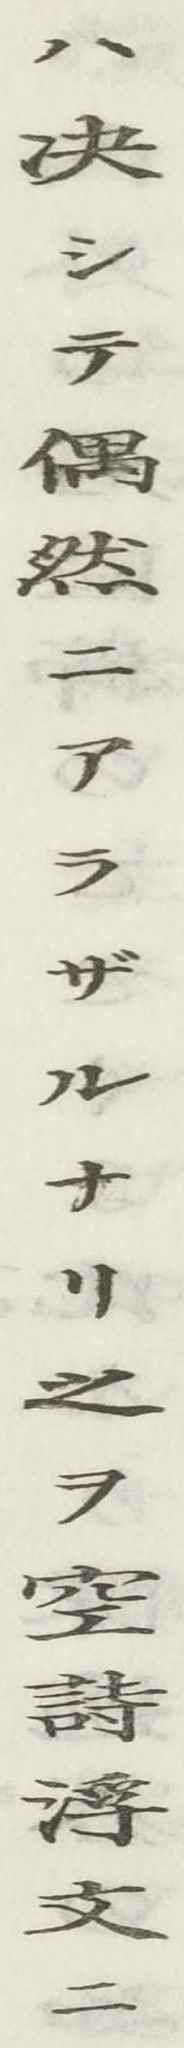ハ決シテ偶然ニアラザルナリ之ヲ空詩浮文ニ
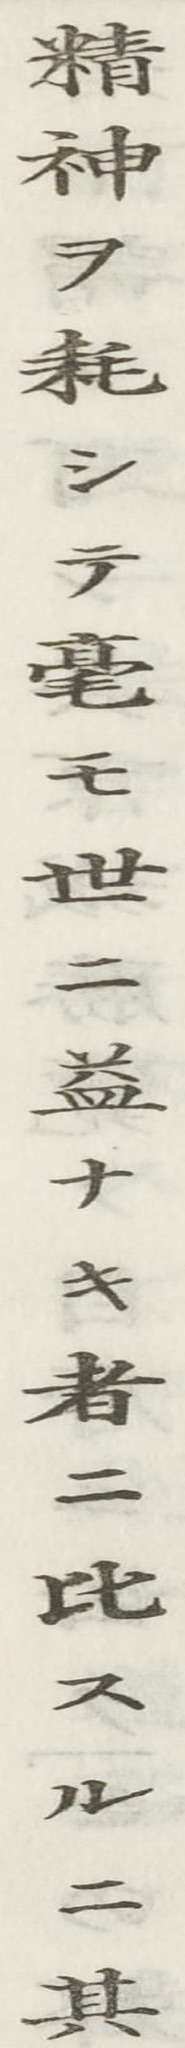精神ヲ耗シテ毫モ世ニ益ナキ者ニ比スルニ其
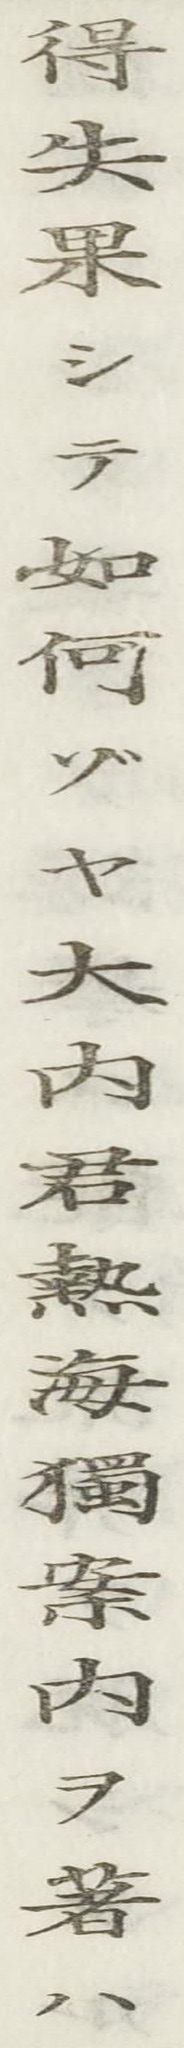得失果シテ如何ゾヤ大内君熱海獨案内ヲ著ハ
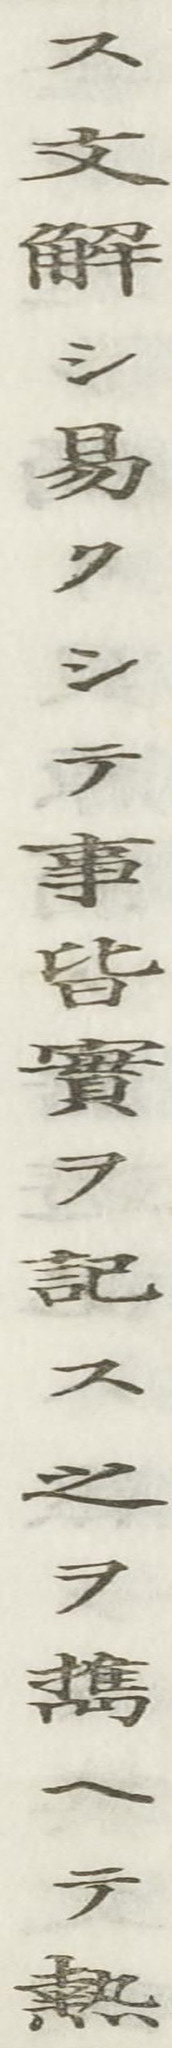ス文解シ易クシテ事皆実ヲ記ス之ヲ携ヘテ熱
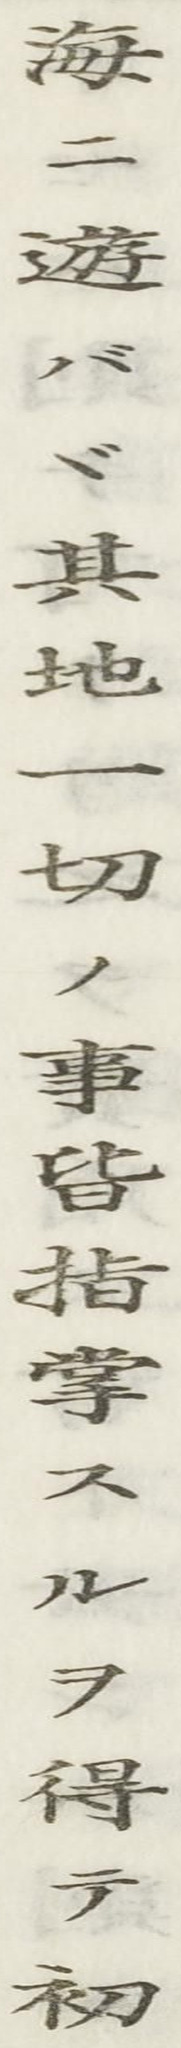海ニ遊バヾ其地一切ノ事皆指掌スルヲ得テ初
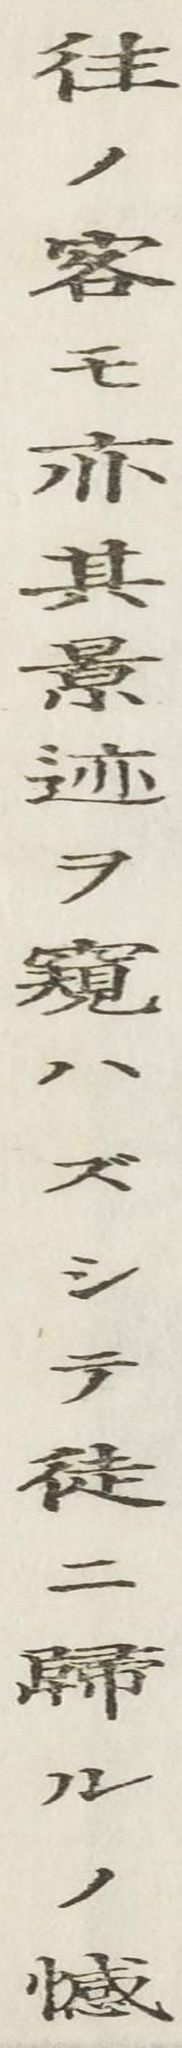往ノ客モ亦其景述を窺ハズシテ徒ニ帰ルノ憾
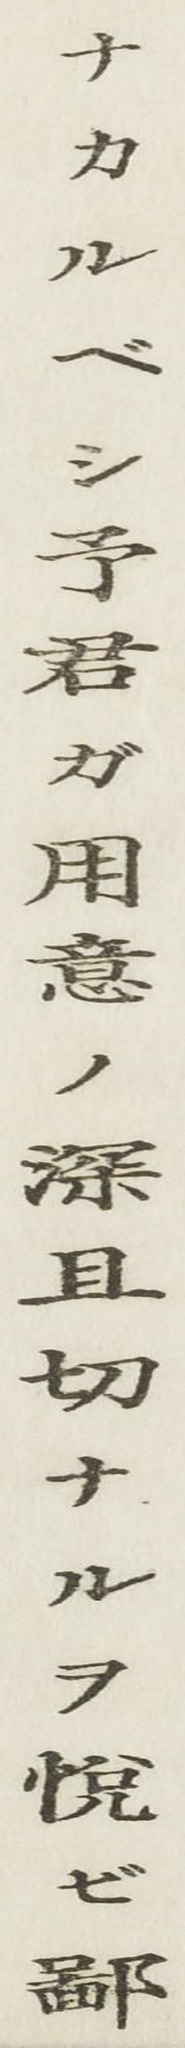ナカルベシ予君ガ用意ノ深且切ナルヲ悦ビ鄙
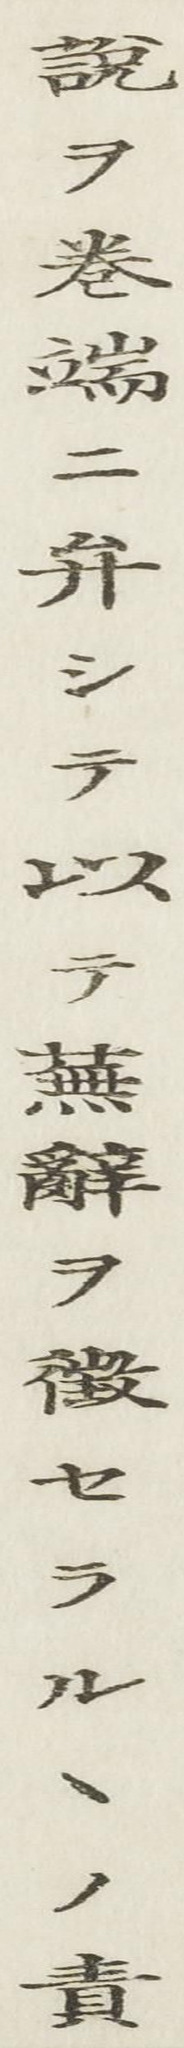説ヲ巻端ニ弁シテ以テ蕪辞ヲ徴セラルヽノ責
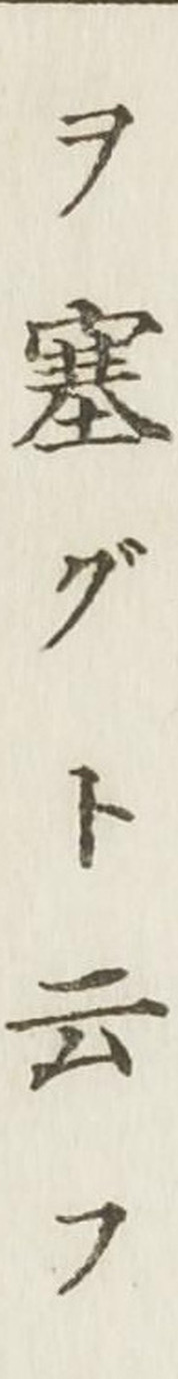ヲ塞グト云フ

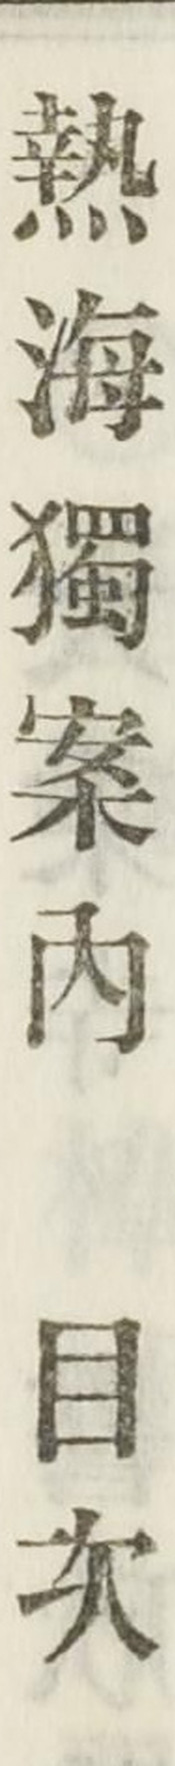熱海獨案内目次
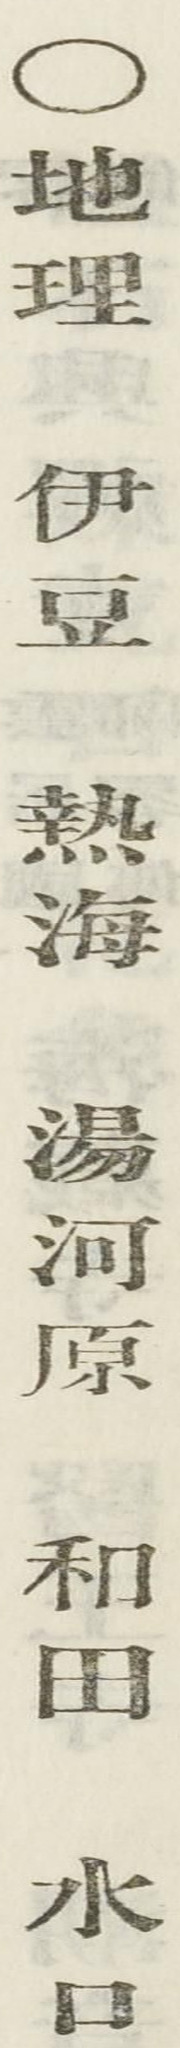〇地理伊豆熱海湯河原和田水口
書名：熱海獨案内　全
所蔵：東京大学地震研究所図書室 Earthquake Research Institute Library, The University of Tokyo, JAPAN
